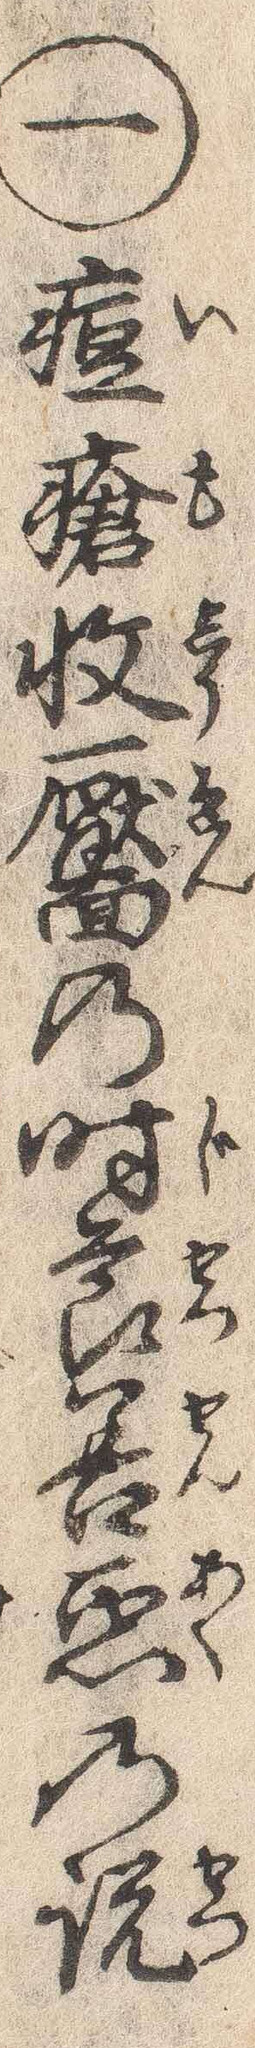㊀痘瘡収靨の時節善悪の説
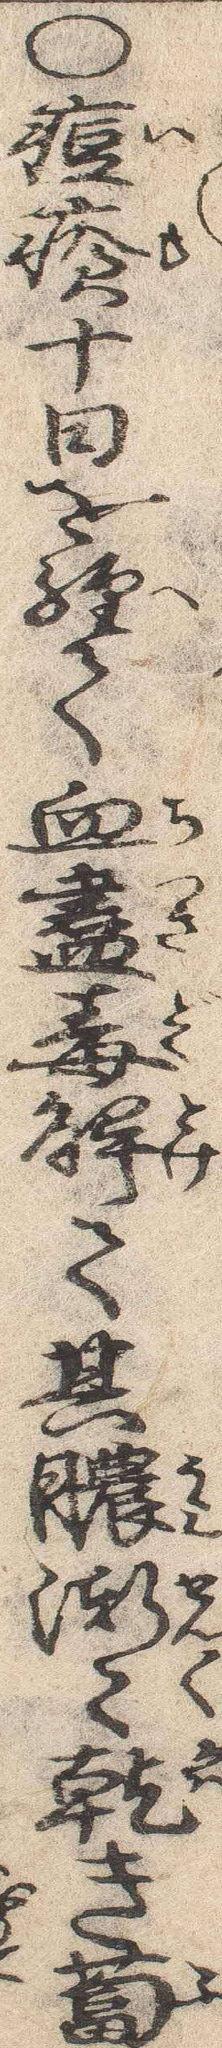○痘瘡十日を経て血尽毒解て其膿漸々乾き葡
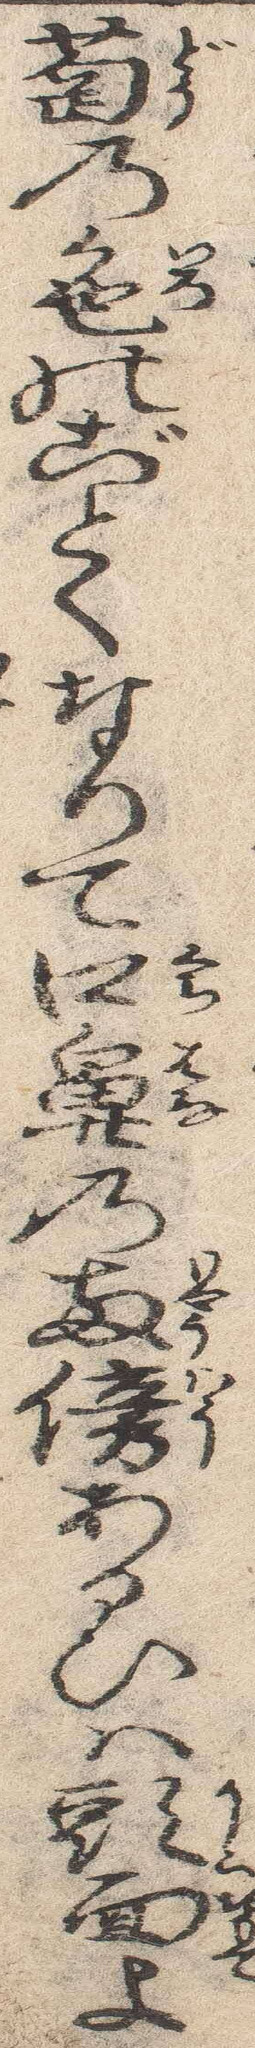萄の色のごとくなりて口鼻の両傍あるひは頭面よ
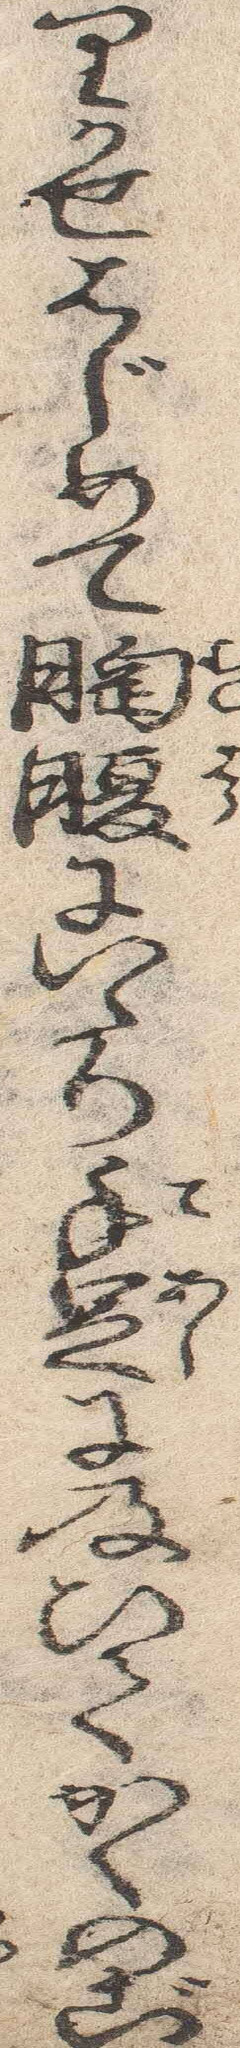りかせはじめて胸腹にいたり手足に及ひてかくのご
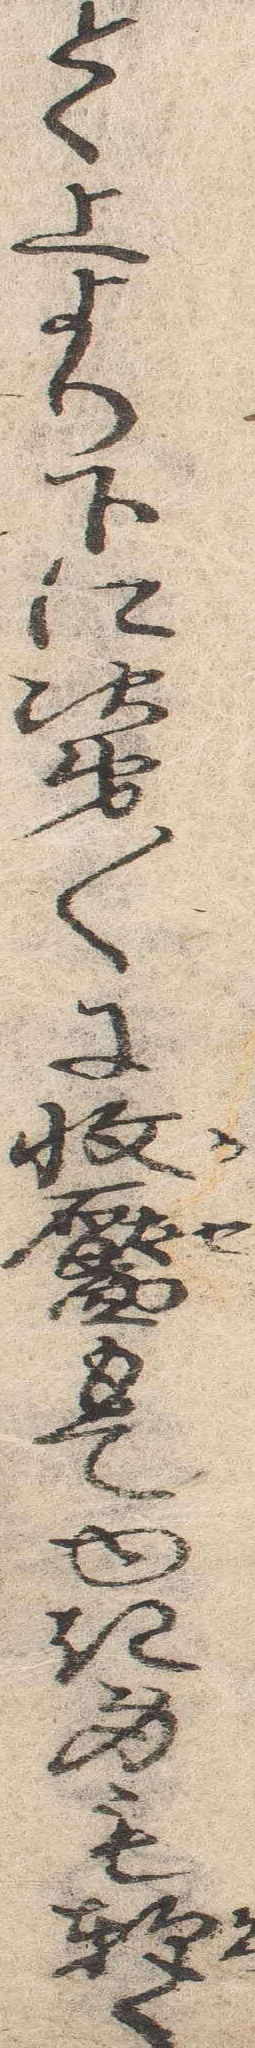とく上より下に次第〳〵に収靨もてゆき身も軽く
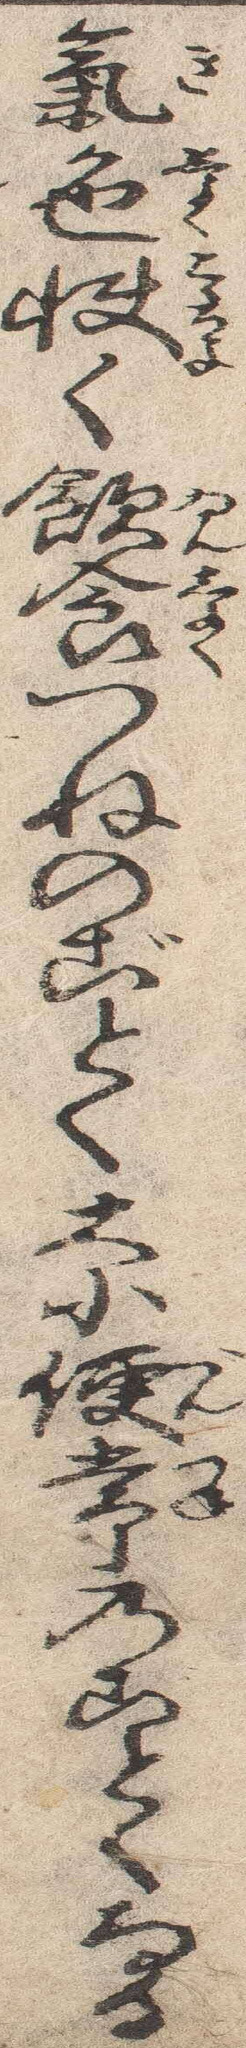気色快く飲食つねのごとく大小便常のことくなる
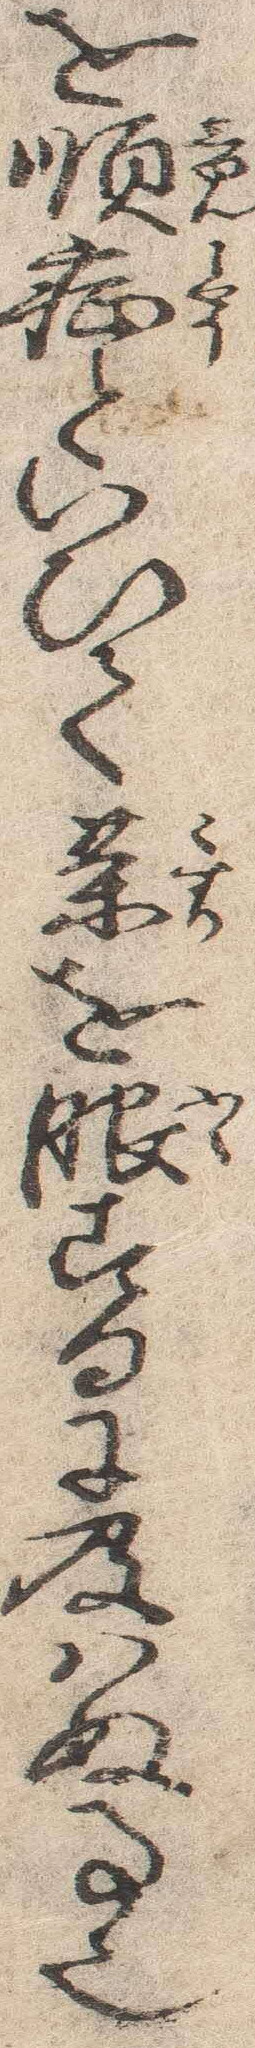を順症といひて薬を服するに及はぬ事也
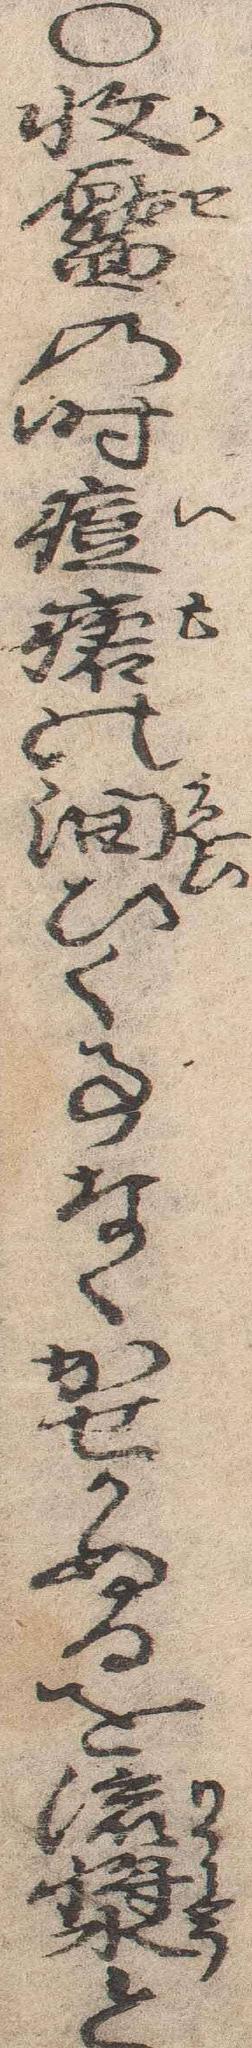○収靨の時痘瘡の潤ひく事なくかせかぬるを流漿と

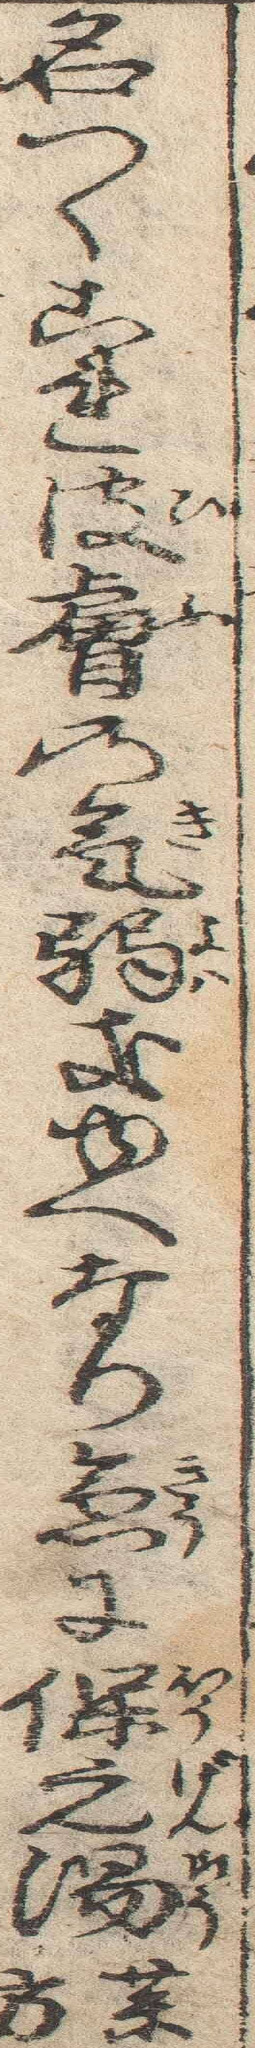名つくこれ皮膚の気弱きゆへなり急に保元湯薬方
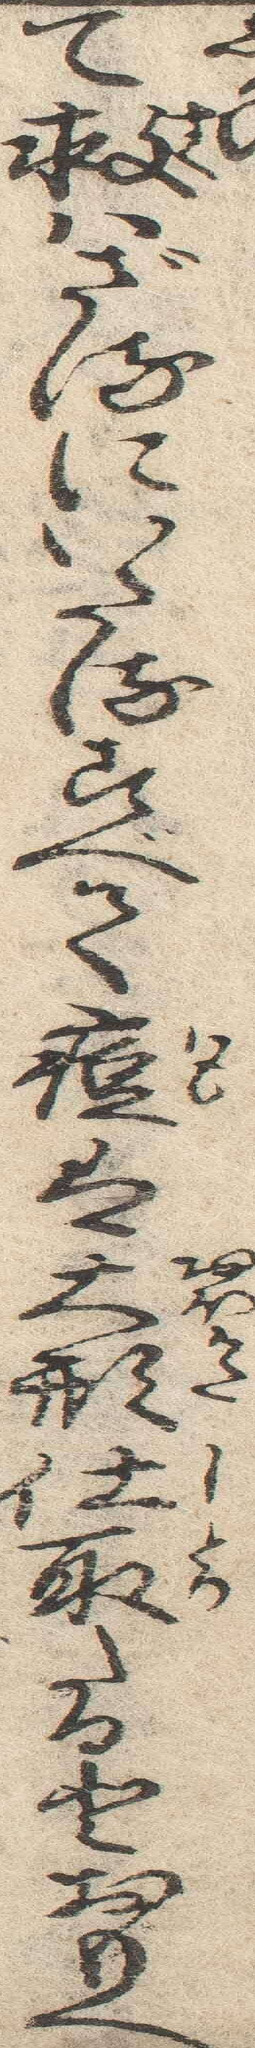て救はざるにいたるすべて痘は大形仕取たるとおもへ
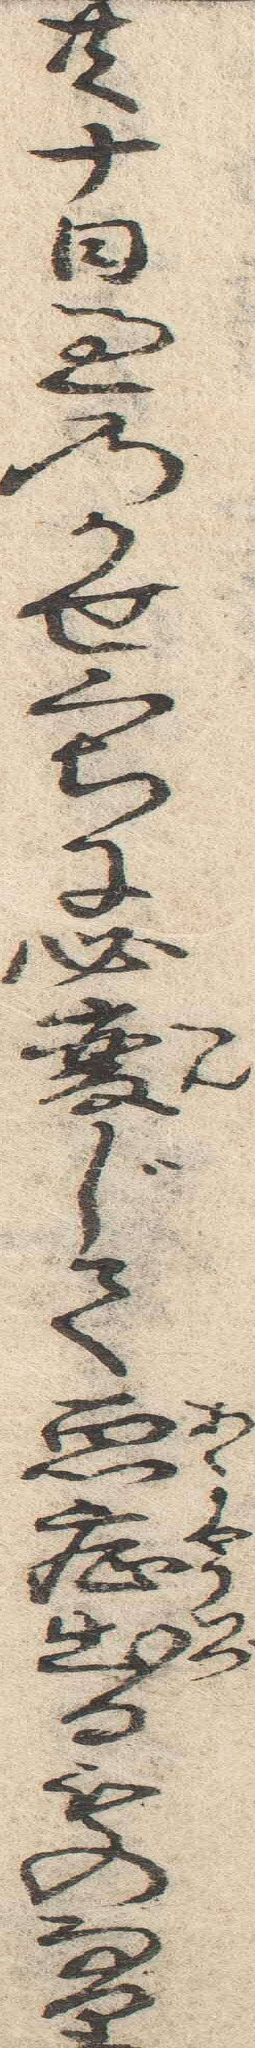共十日過のかせくちに必変じて悪症出るものなり
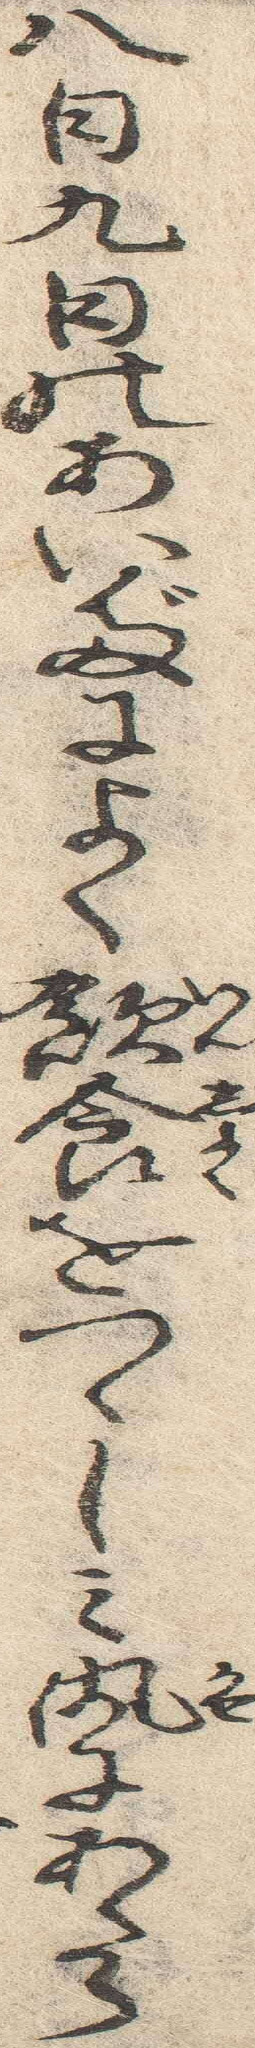八日九日のあいだによく飲食をつゝしみ風にあたら
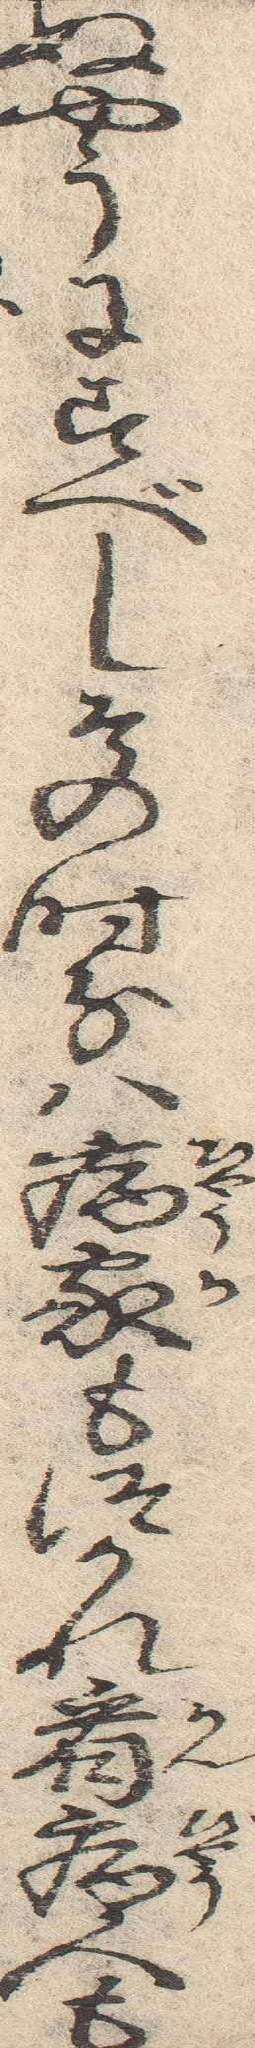ぬやうにすべしその時分は病家もつかれ看病人も
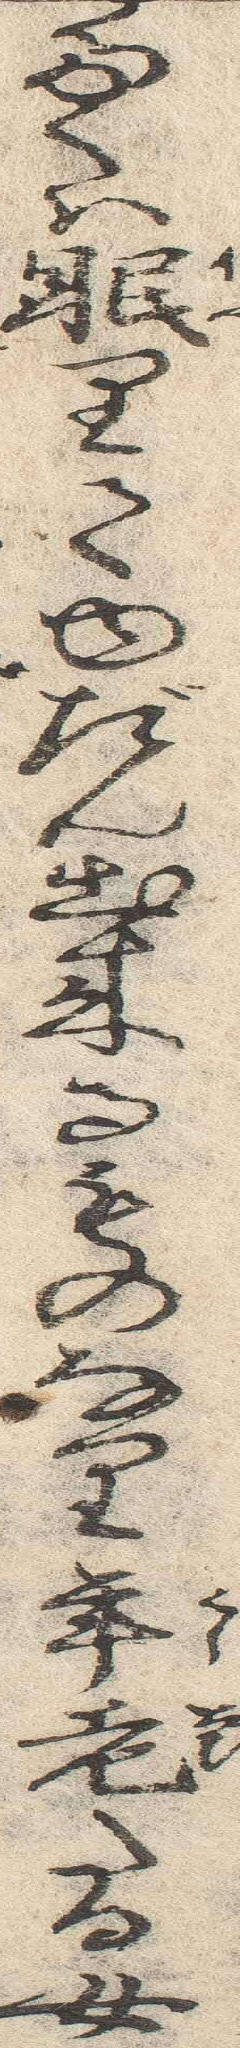多くは眠りてゆだん出来るものなり年老たる女
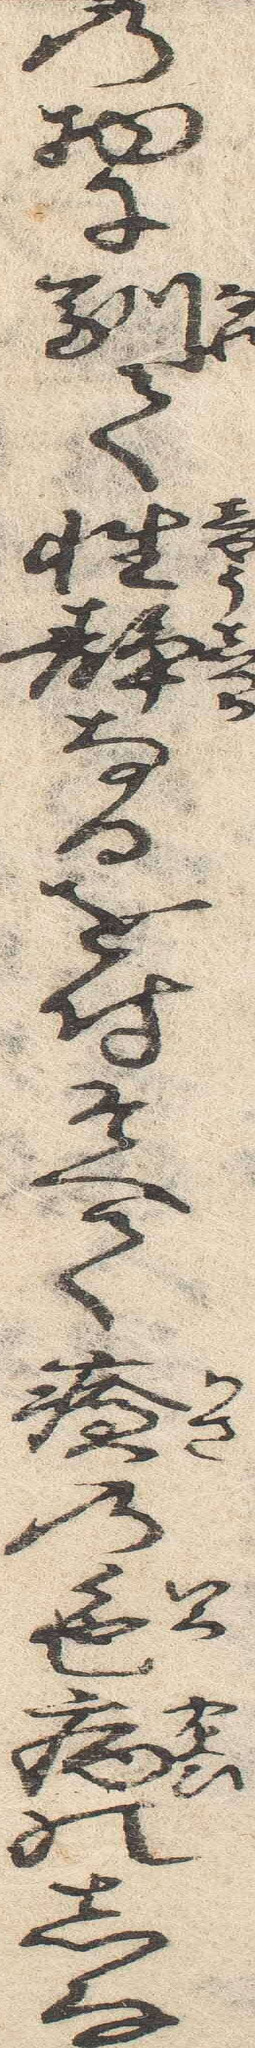の物に馴て性静なるを付そへて瘡の色病のしな
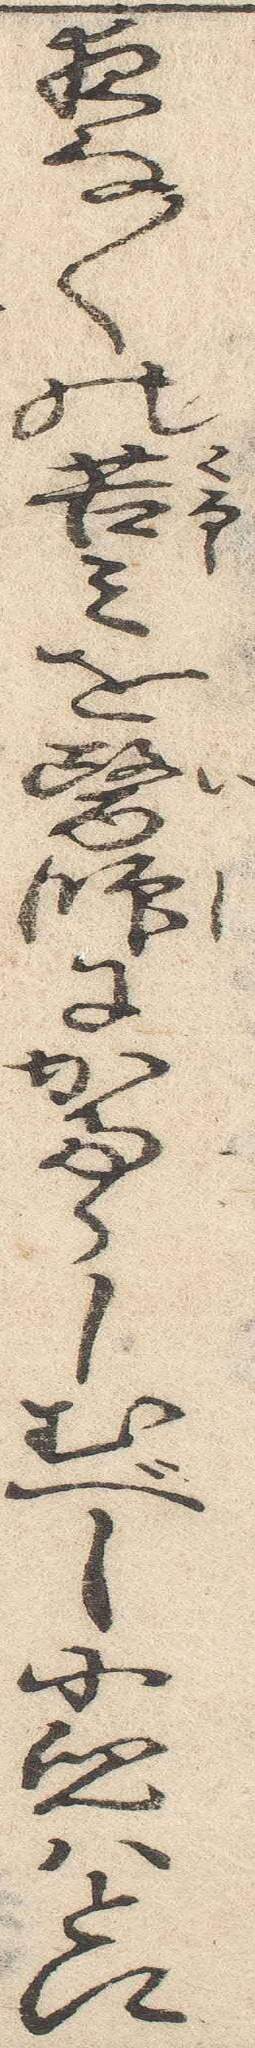夜な〳〵の苦みを医師にかたらしむべし小児はとに
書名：小児必用養育草
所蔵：東京学芸大学附属図書館 国文学研究資料館
